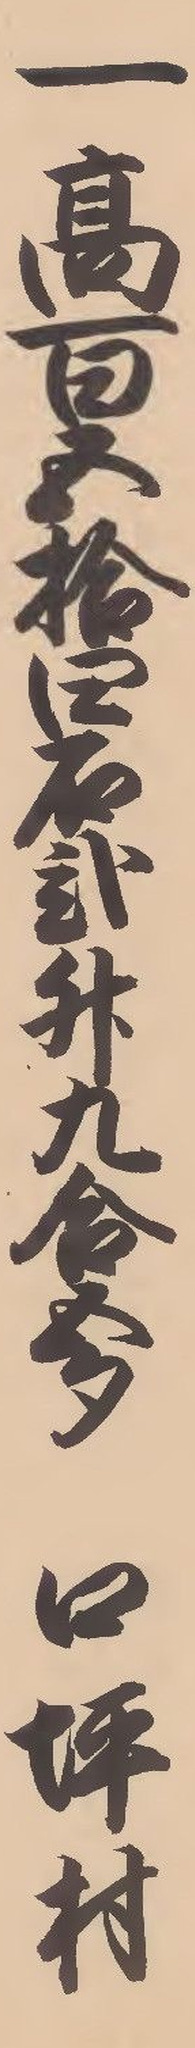一髙百五拾四石弐升九合五夕口坪村
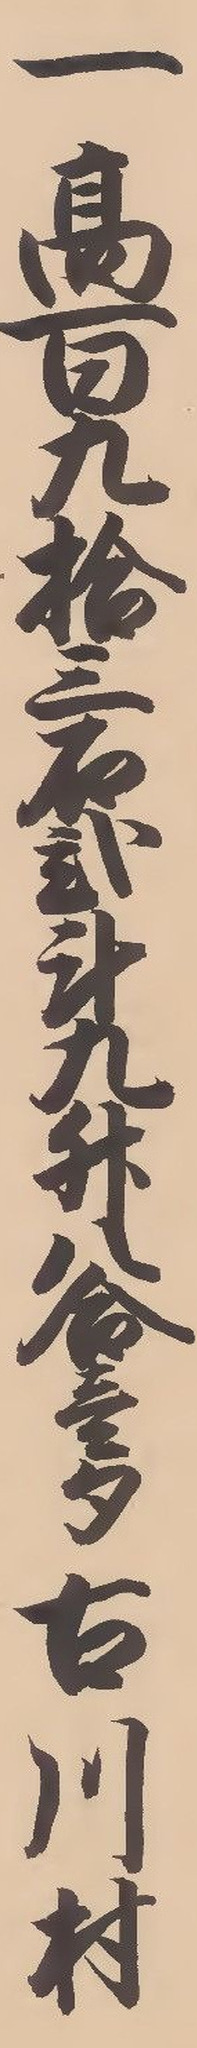一髙百九拾三石弐斗九升八合壱夕古川村
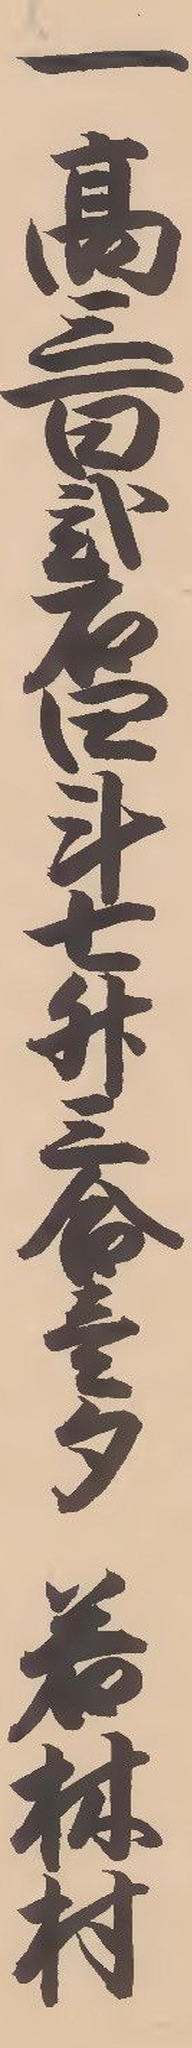一髙三百弐石四斗七升三合壱夕若林村
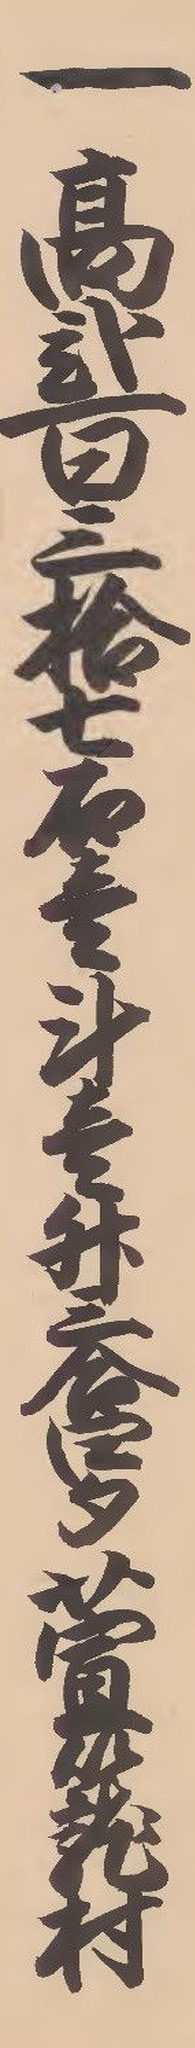一髙弐百三拾七石壱斗壱升三合四夕萱籠村
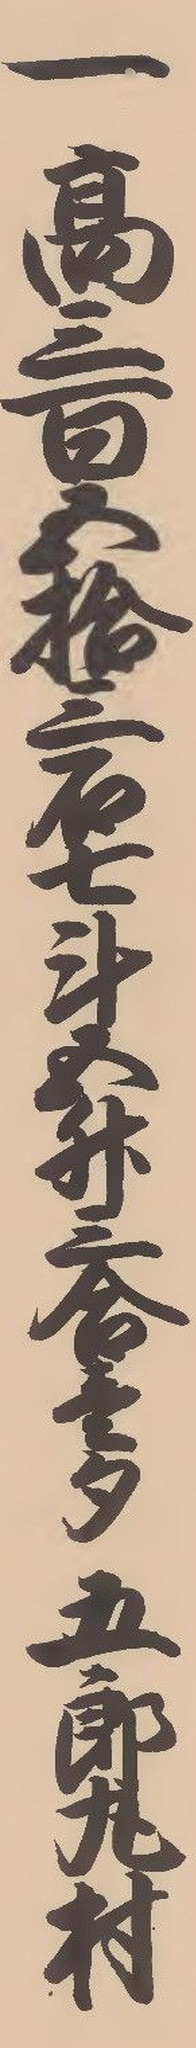一髙三百五拾三石七斗五升三合七夕五郎丸村
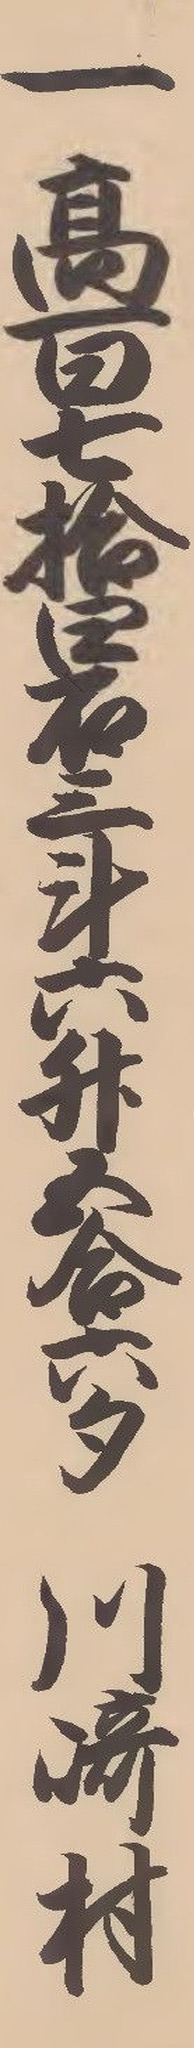一髙百七拾四石三斗六升五合六夕川崎村
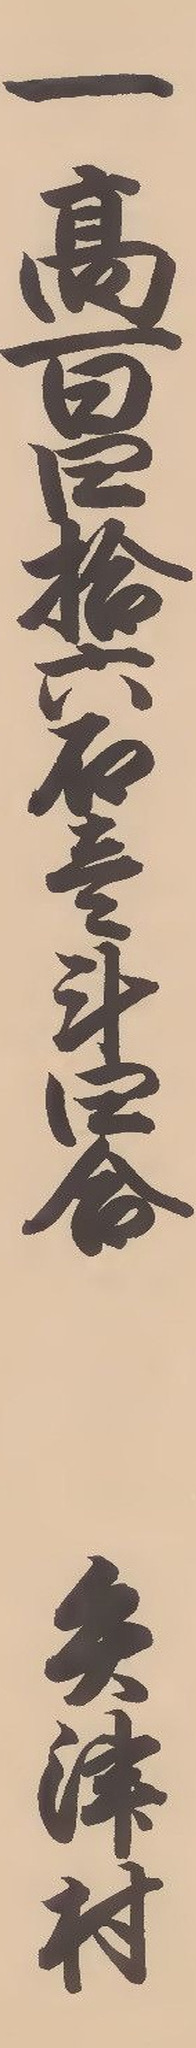一髙百四拾六石壱斗四合矢津村
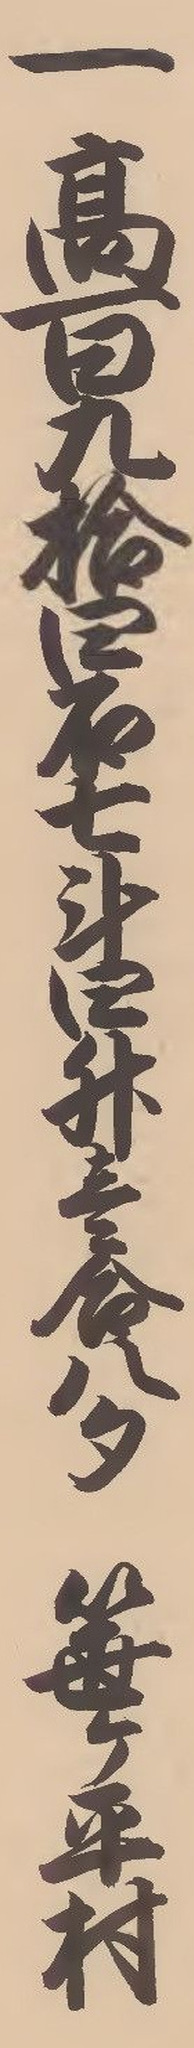一髙百九拾四石七斗四升壱合八夕笹ケ平村

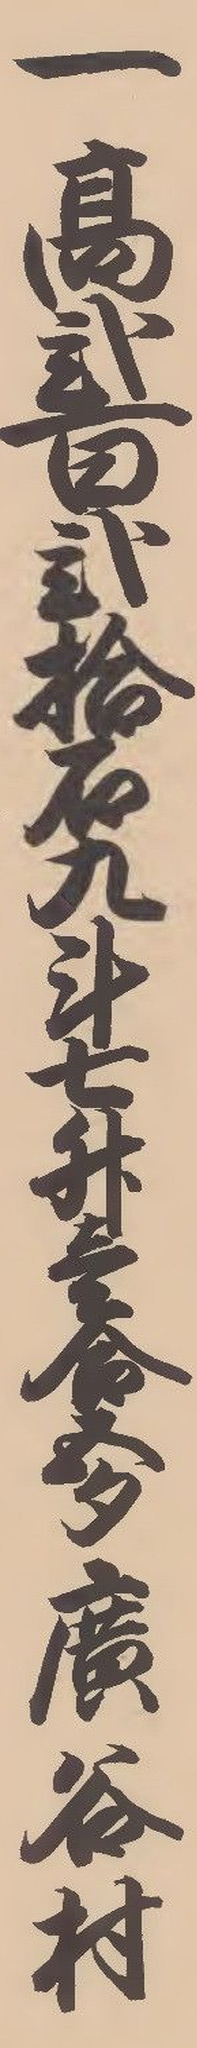一髙弐百弐拾石九斗七升壱合五夕廣谷村
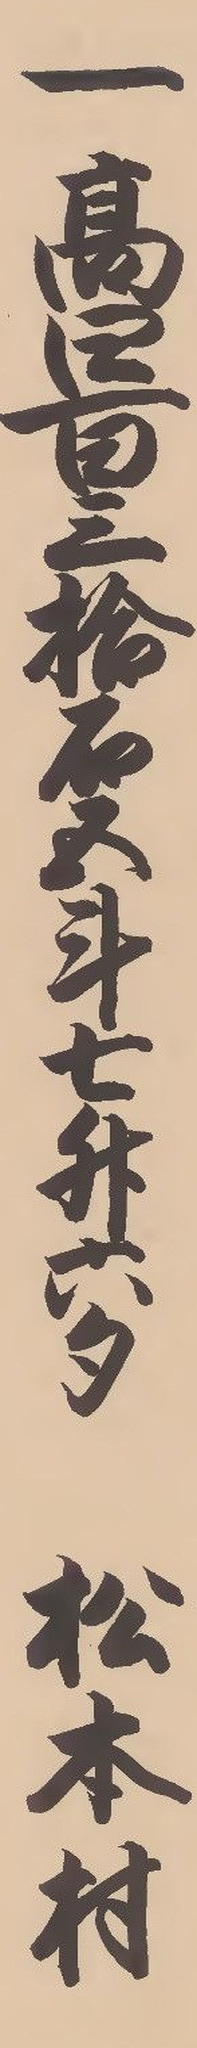一髙四百三拾石五斗七升六夕松本村
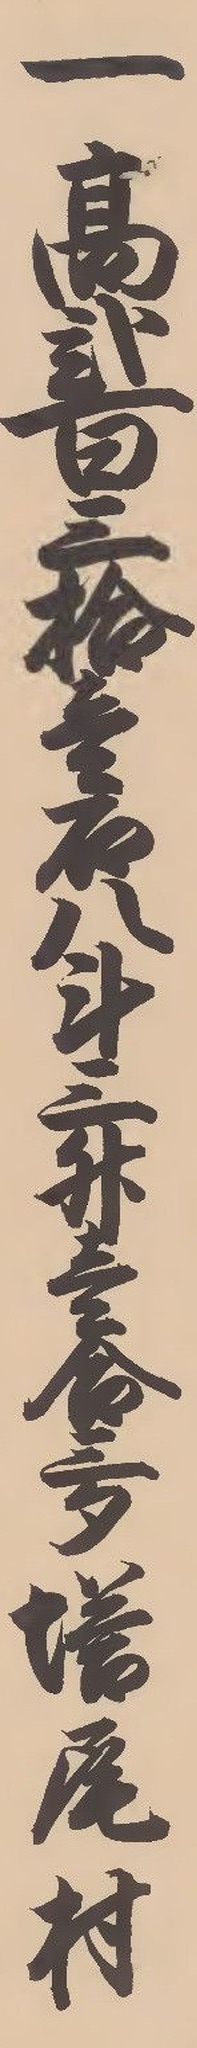一髙弐百三拾壱石八斗三升壱合三夕塔尾村
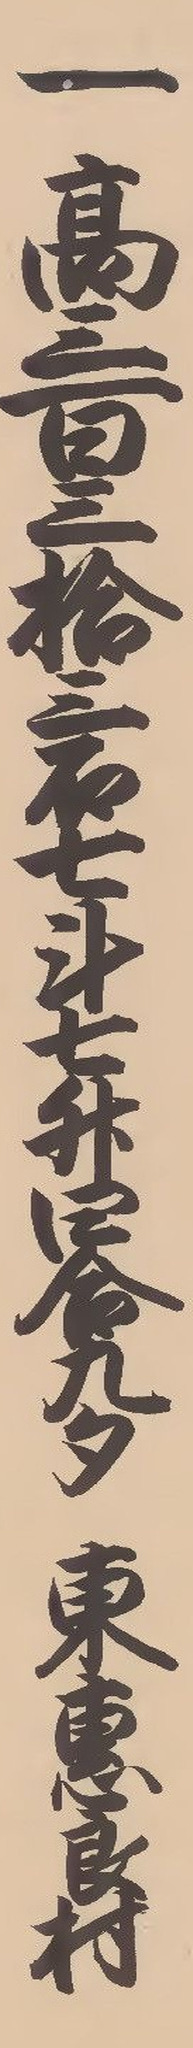一髙三百三拾三石七斗七升四合九夕東惠良村
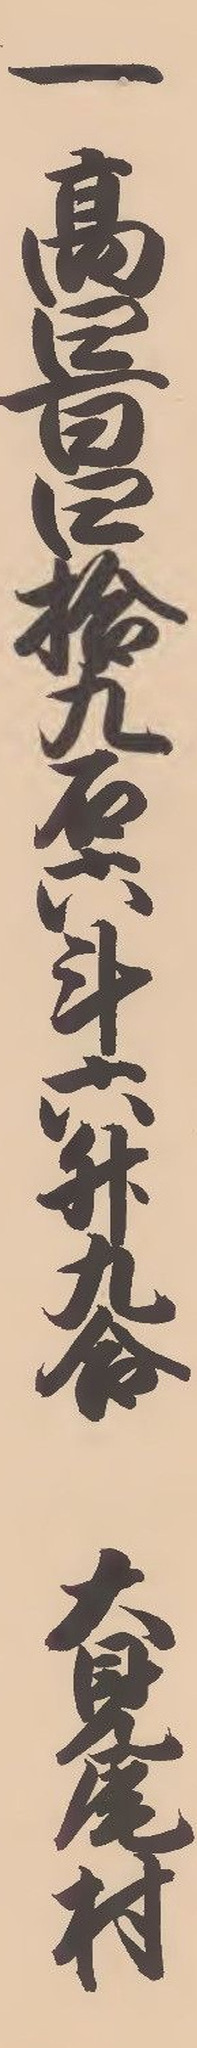一髙四百四拾九石六斗六升九合大見尾村
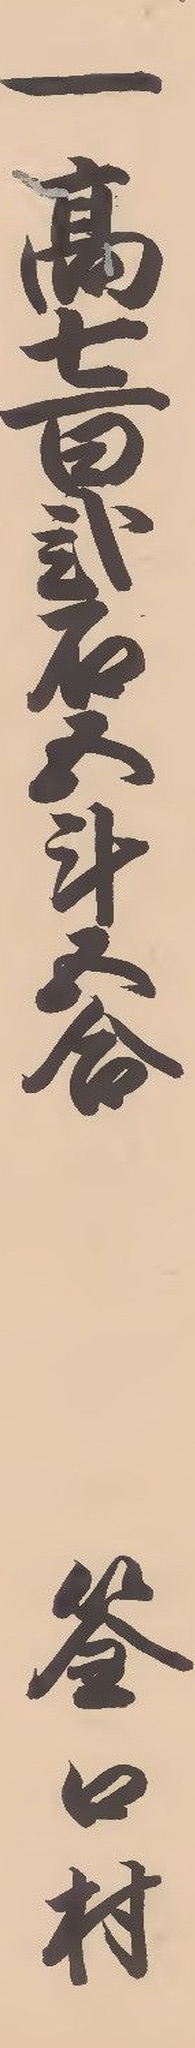一髙七百弐石五斗五合口村
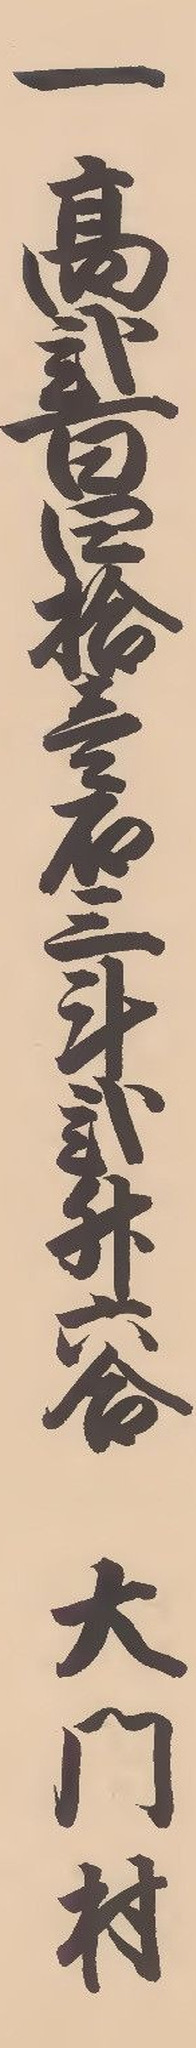一髙弐百四拾壱石三斗弐升六合大門村
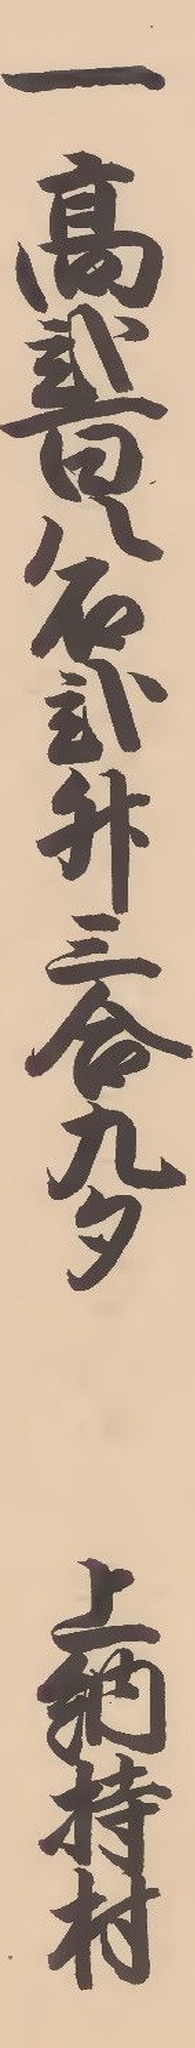一髙弐百八石弐升三合九夕上納持村
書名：豊前国郷帳
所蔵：国立公文書館 National Archives of Japan
